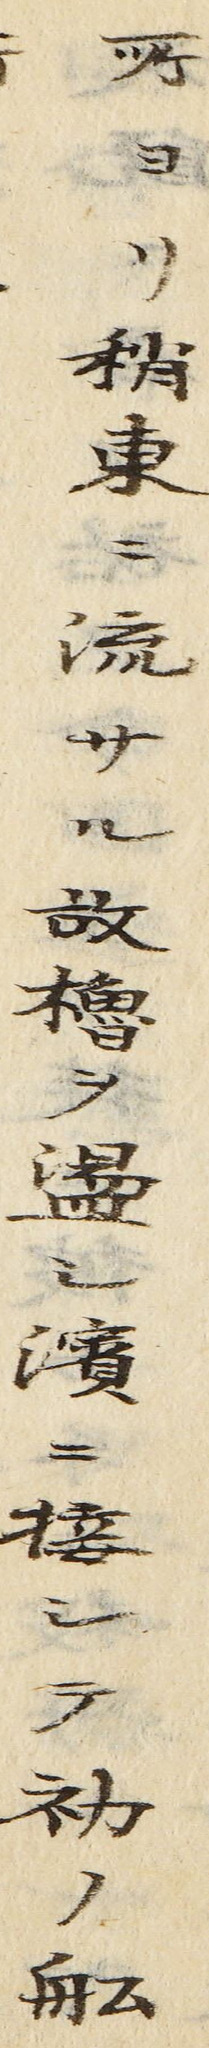所ヨリ稍東ニ流サル故櫓ヲ盪シ浜ニ接シテ初ノ船
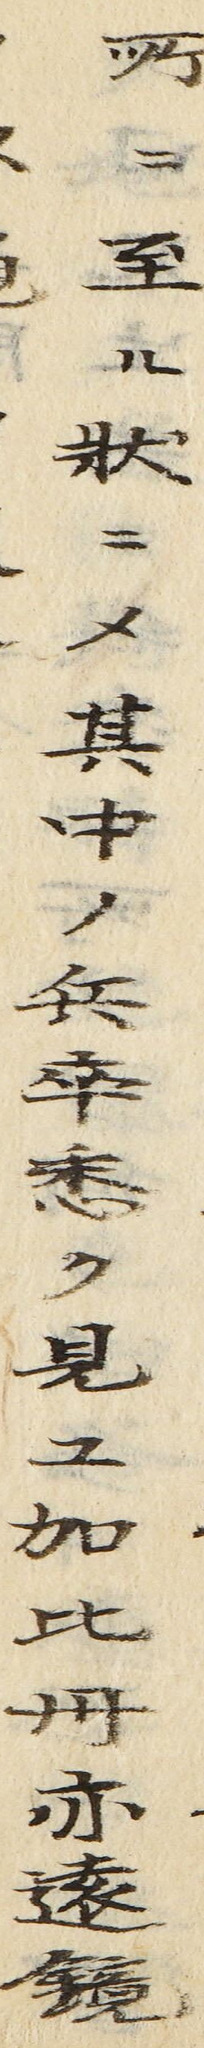所ニ至ル状ニシテ其中ノ兵卒悉ク見ユ加比丹亦遠鏡
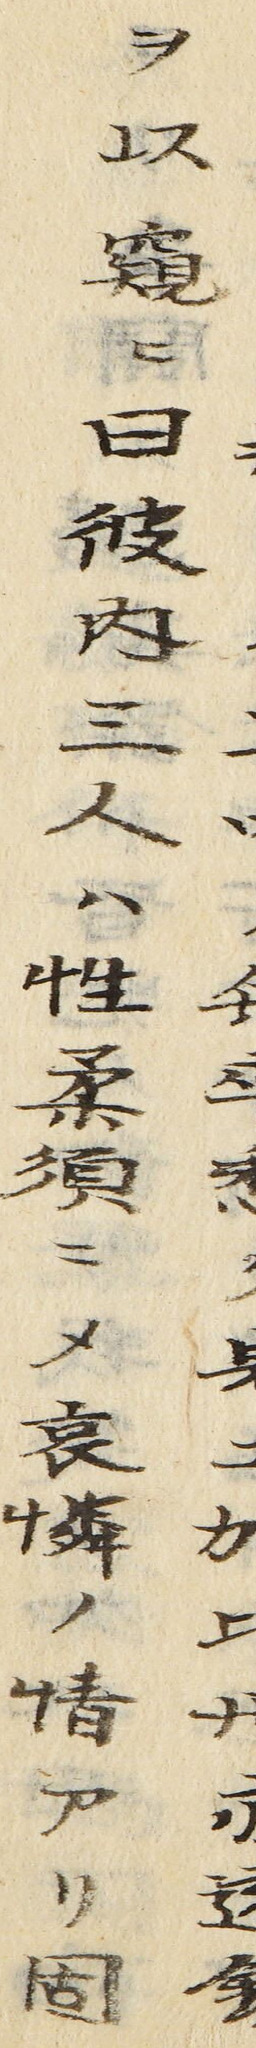ヲ以窺ヒ曰彼内三人ハ性柔須ニシテ哀憐ノ情アリ固

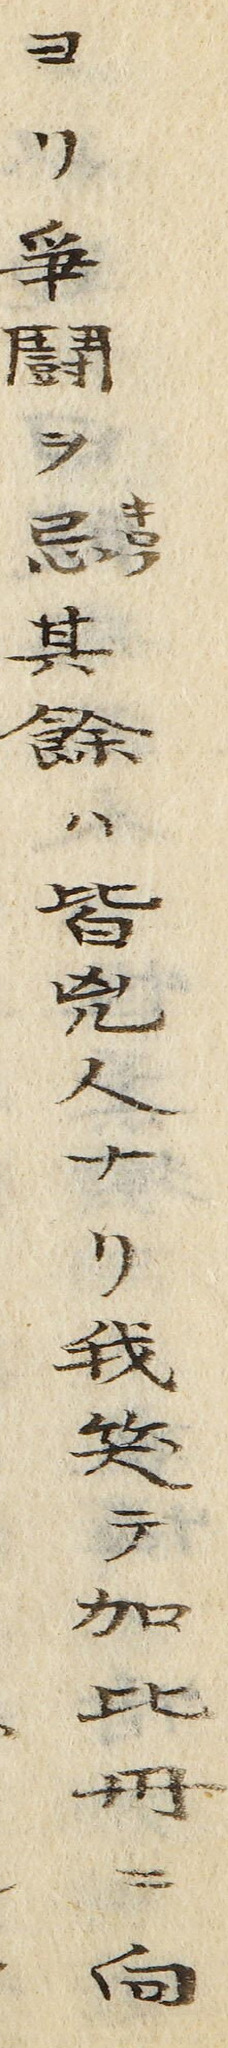ヨリ争闘ヲ忌其余ハ皆兇人ナリ我笑テ加比丹ニ向
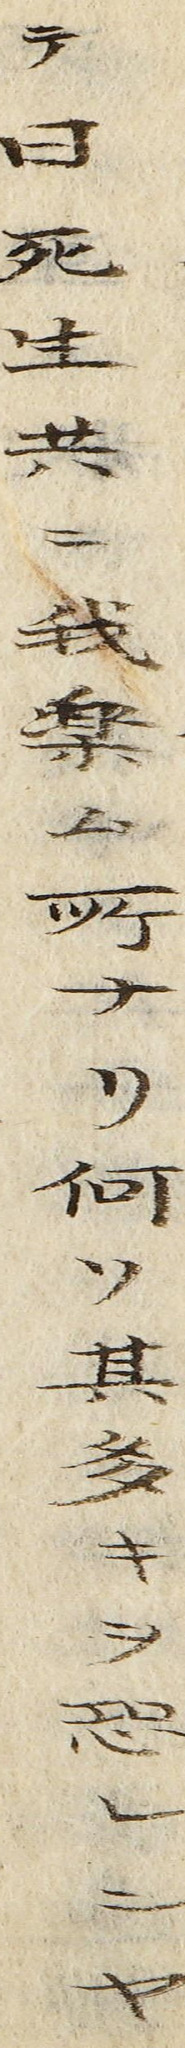テ曰死生共ニ我楽ム所ナリ何ソ其多キヲ恐レンヤ
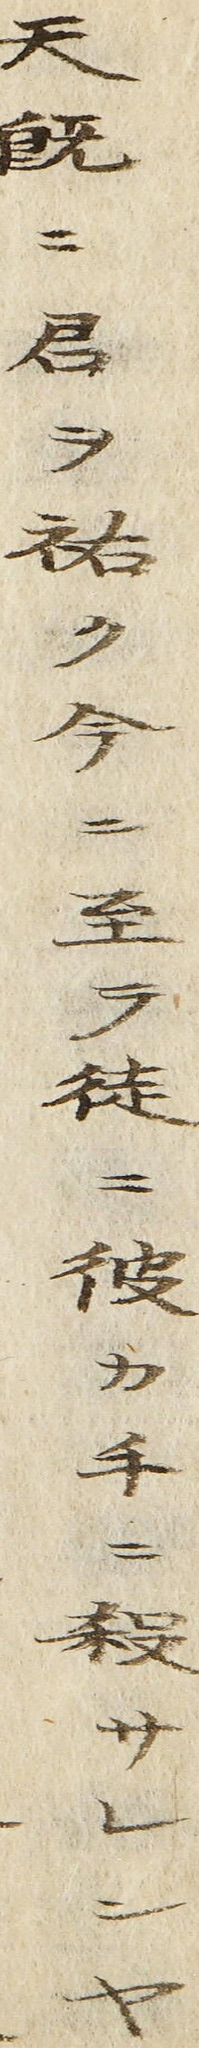天既ニ君ヲ祐ク今ニ至テ徒ニ彼カ手ニ殺サレンヤ
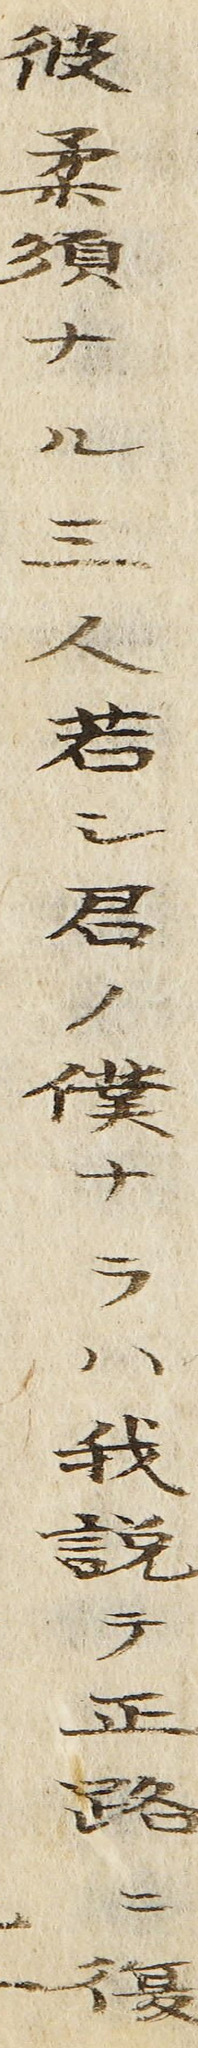彼柔須ナル三人若シ君ノ僕ナラハ我説テ正路ニ復
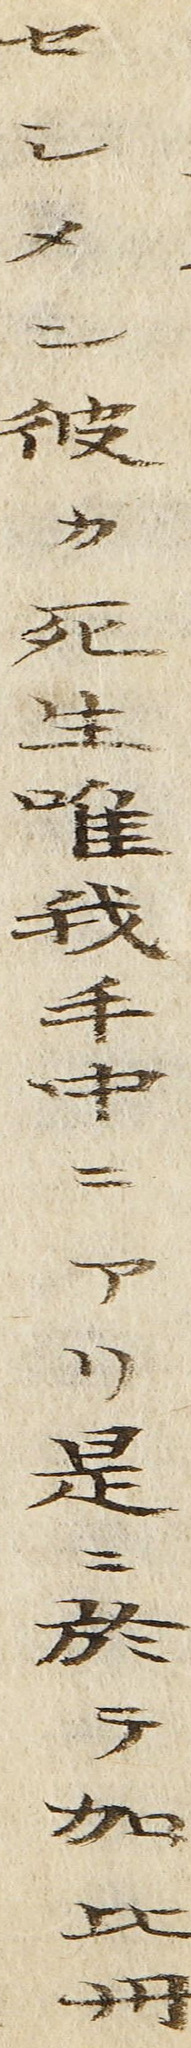セシメン彼カ死生唯我手中ニアリ是ニ於テ加比丹
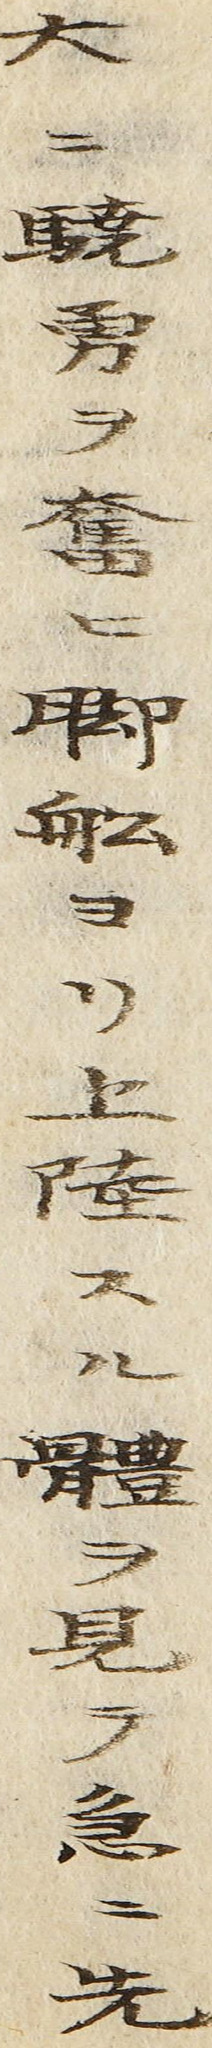大ニ驍勇ヲ奮ヒ脚船ヨリ上陸スル体ヲ見テ急ニ先
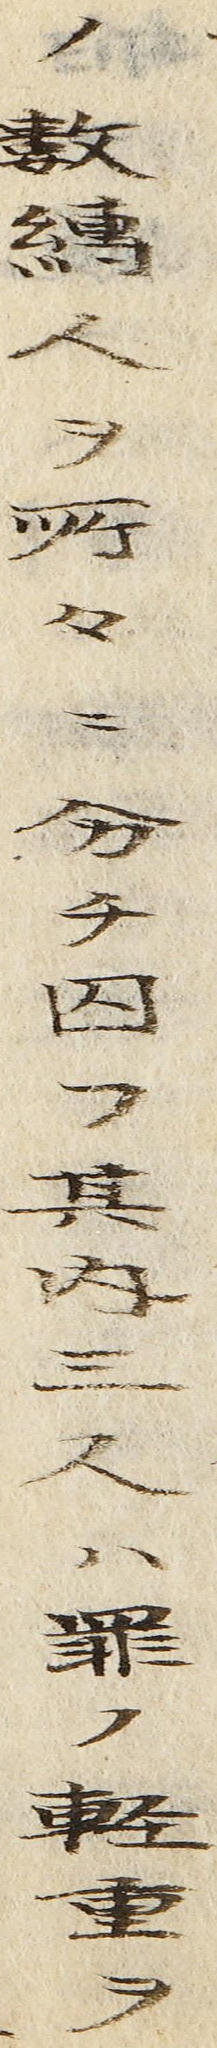ノ数縛人ヲ所々ニ分チ囚フ其内三人ハ罪ノ軽重ヲ
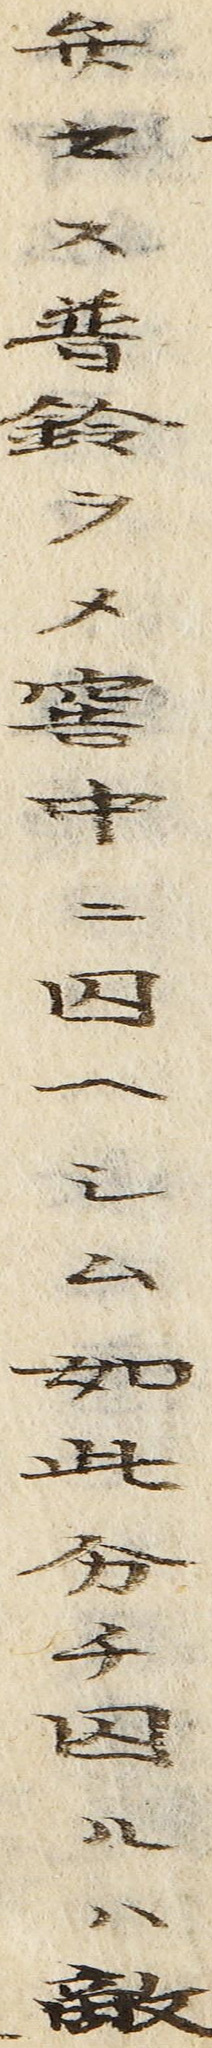弁セス普鈴ヲシテ窖中ニ囚ヘシム如此分チ囚ルハ敵
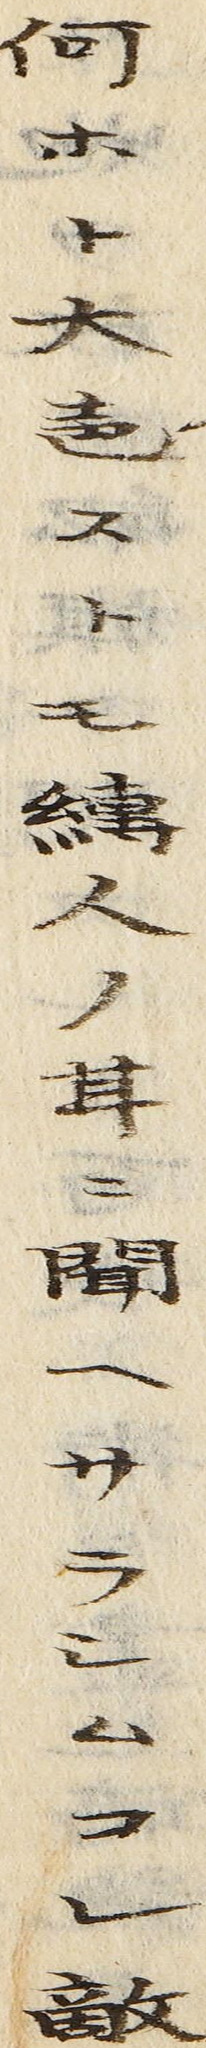何ホト大声ストモ縛人ノ耳ニ聞ヘサラシムコレ敵
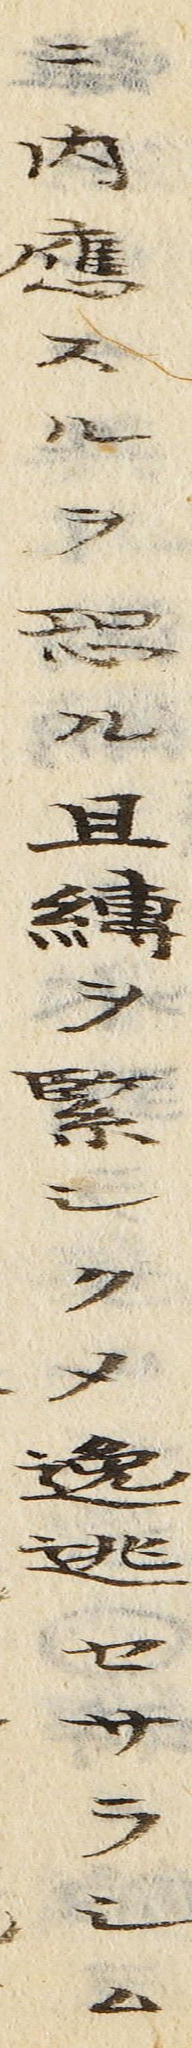ニ内応スルヲ恐ル且縛ヲ緊シクシテ逸逃セサラシム
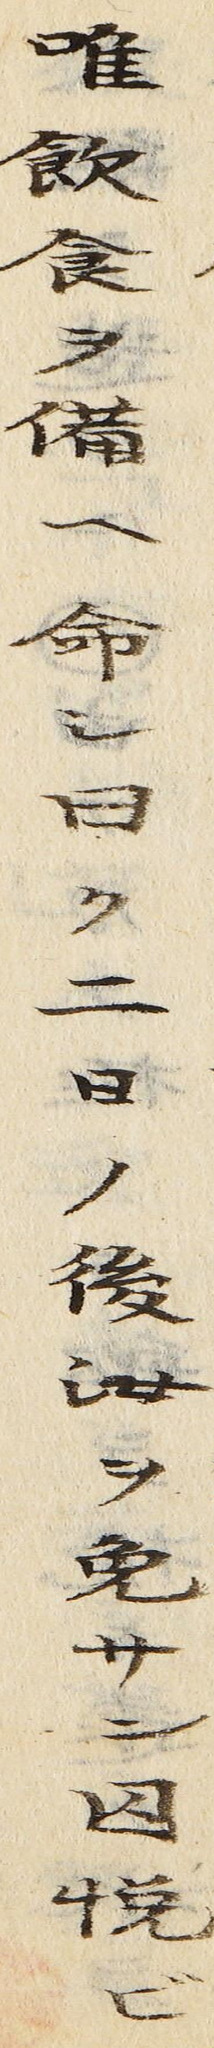唯飲食ヲ備へ命シ曰ク二日ノ後汝ヲ免サン囚悦ビ
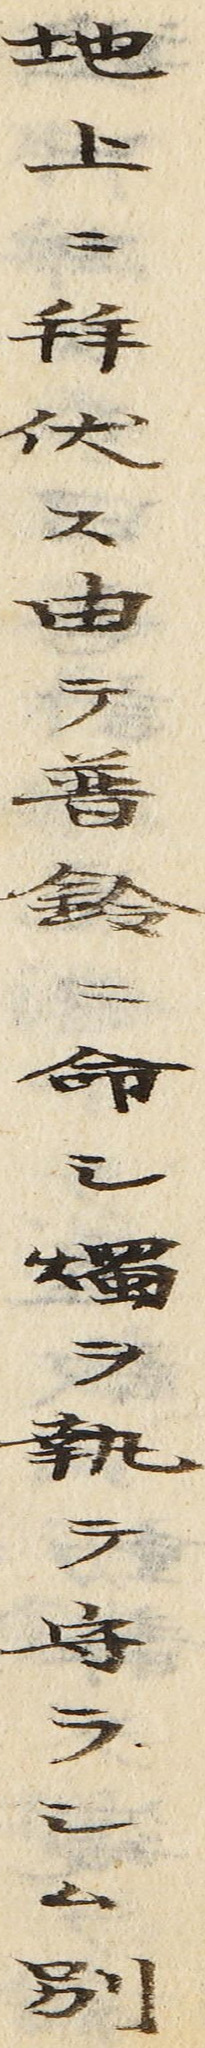地上ニ拝伏ス由テ普鈴ニ命シ燭ヲ執テ守ラシム別
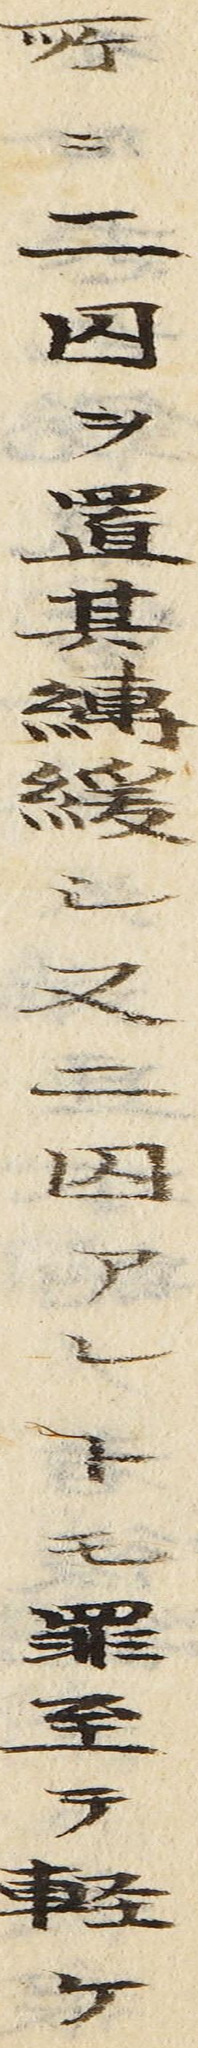所ニ二囚ヲ置其縛緩シ又二囚アレトモ罪至テ軽ケ
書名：漂流紀事
